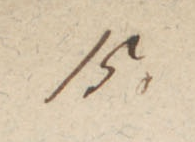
15.
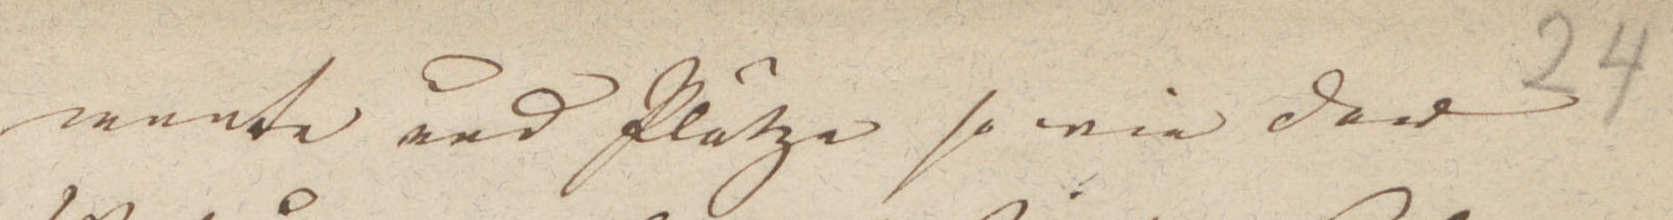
mente und Plätze so wie der
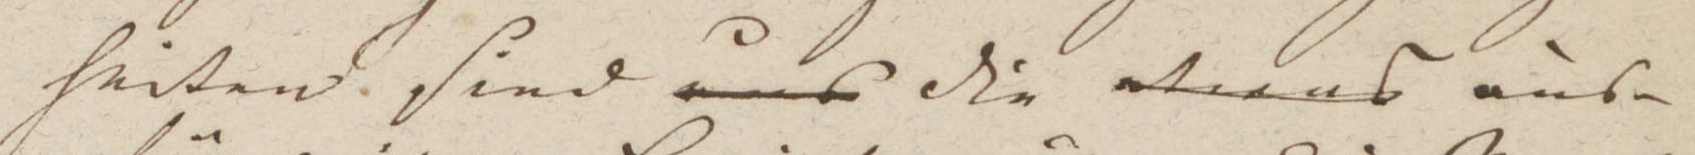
heiten sind die etwas aus-
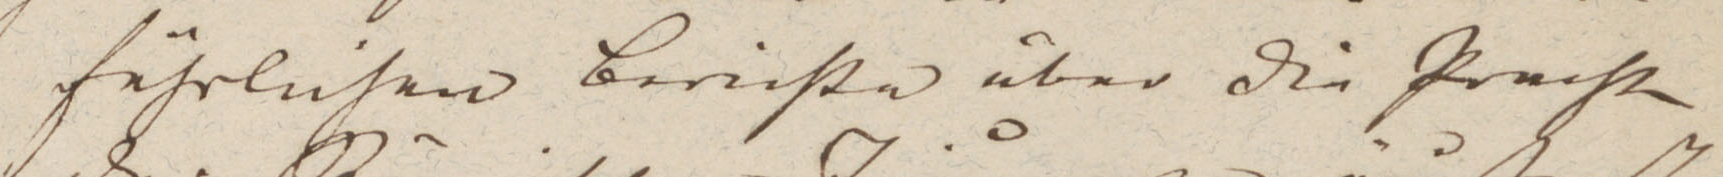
führlichen Berichte über die Pracht
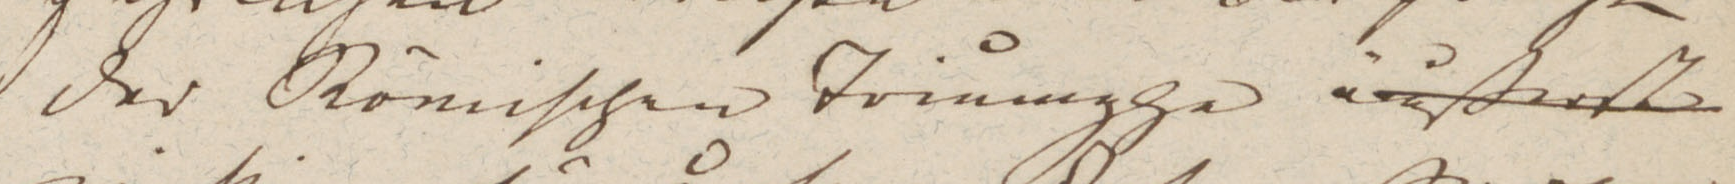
der Römischen Triumphe äusserst
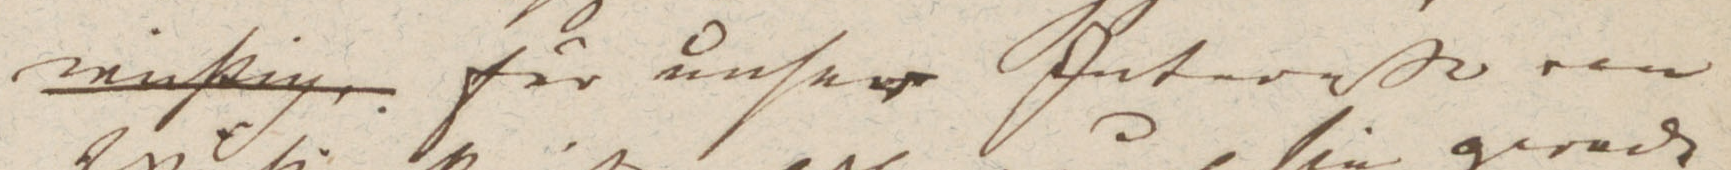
wichtig, für unser Interesse von
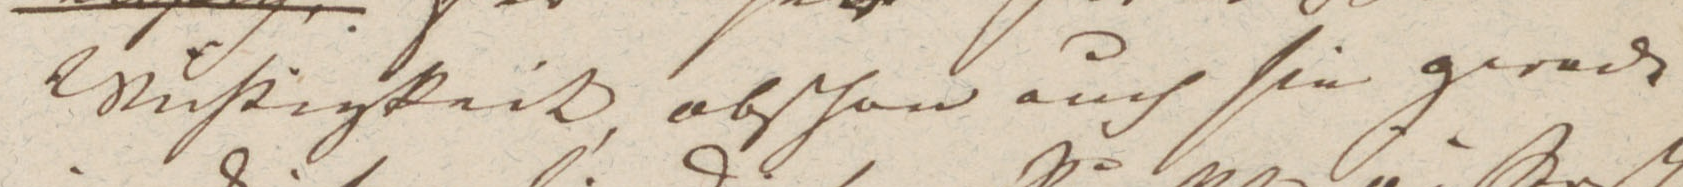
Wichtigkeit, obschon auch sie gerade
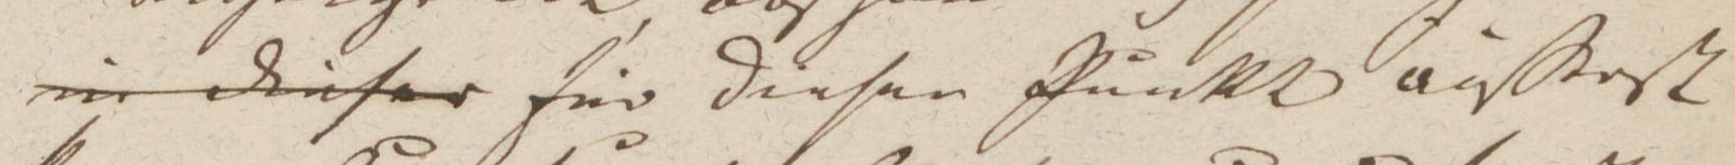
in dieser für diesen Punkt äusserst
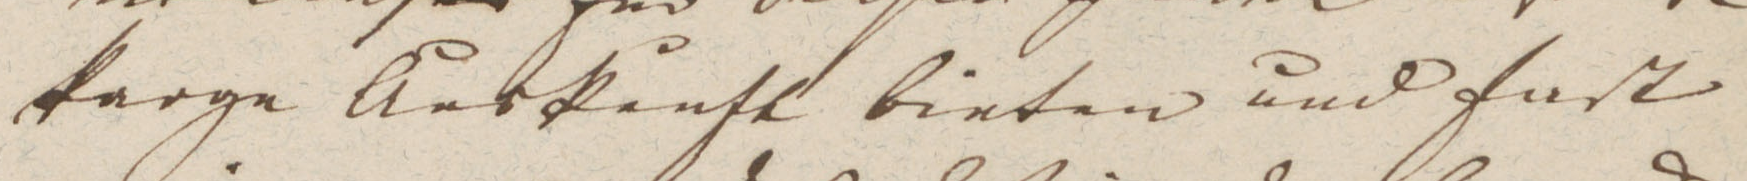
karge Auskunft bieten und fast
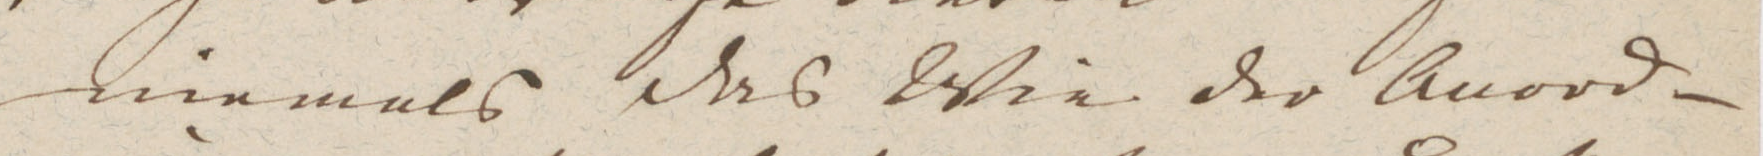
niemals das Wie der Anord-
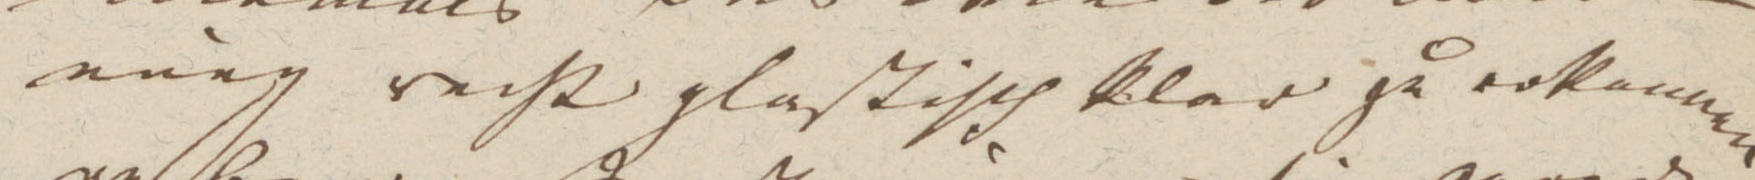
nung recht plastisch klar zu erkennen
